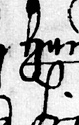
2.
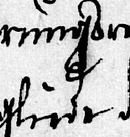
1.
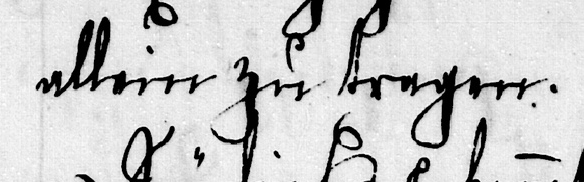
allein zu tragen.
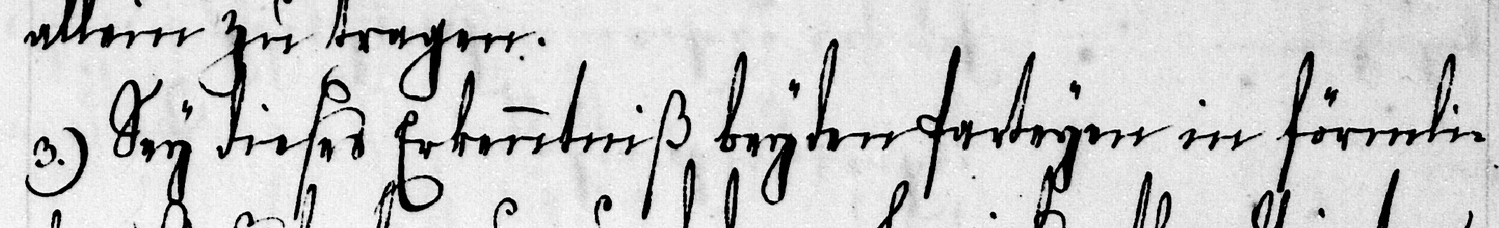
3.) Sey dieses Erkenntniß beyden Parteyen in förmli¬
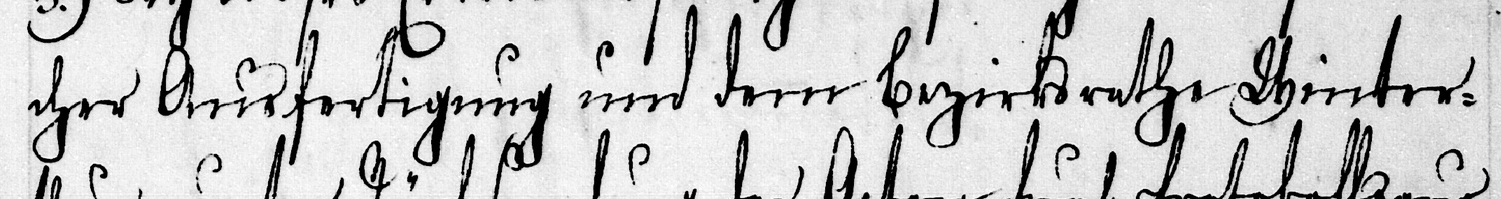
cher Ausfertigung und dem Bezirksrathe Winter¬
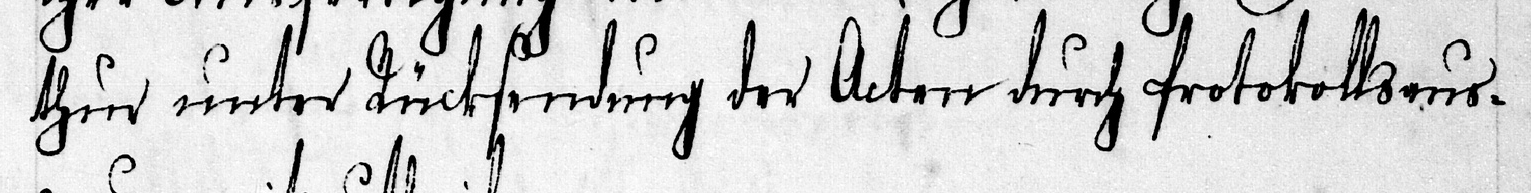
thur unter Rücksendung der Acten durch Protokollsaus¬
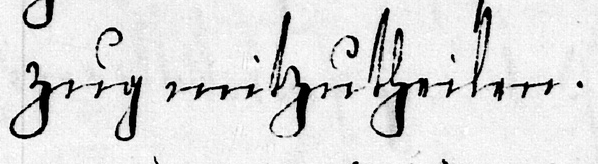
zug mitzutheilen.
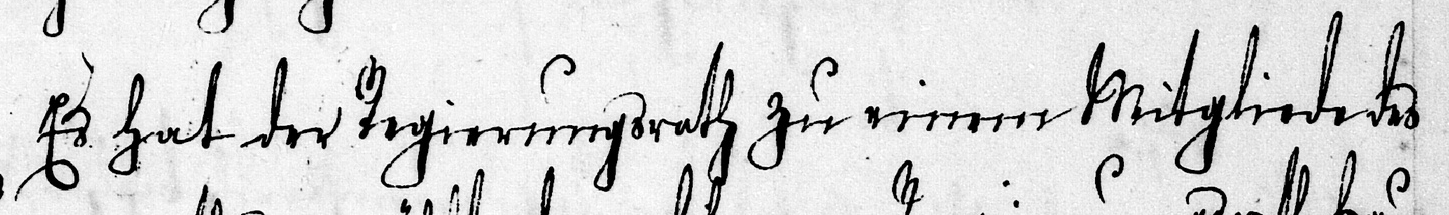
Es hat der Regierungsrath zu einem Mitgliede des
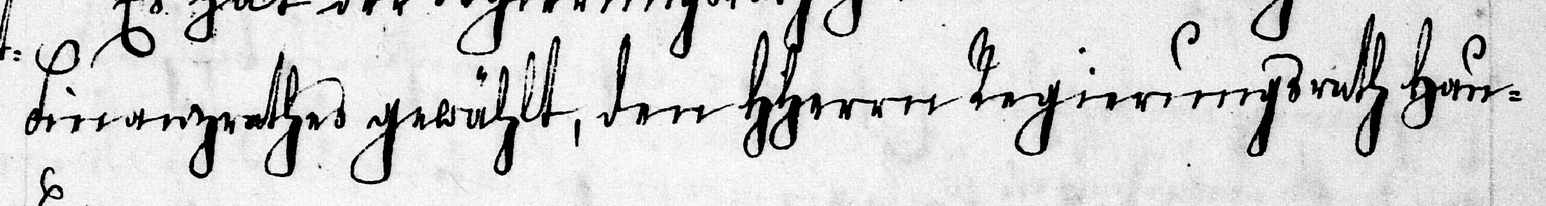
Finanzrathes gewählt, den HHerrn Regierungsrath Hau¬
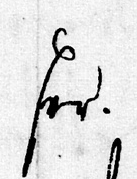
ser.
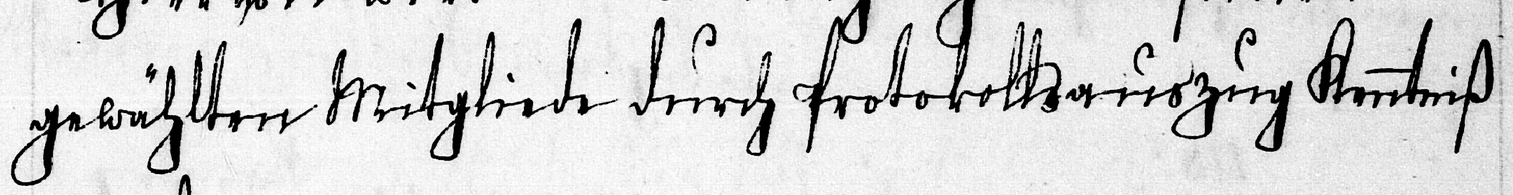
gewählten Mitgliede durch Protokollsauszug Kenntniß
